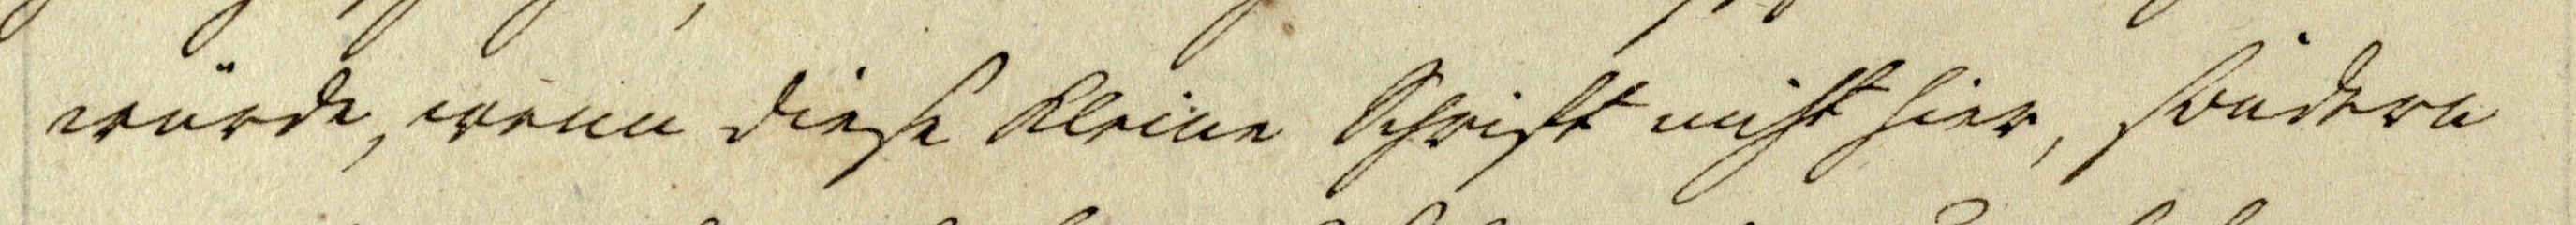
würde, wenn diese kleine Schrift nicht hier, sondern
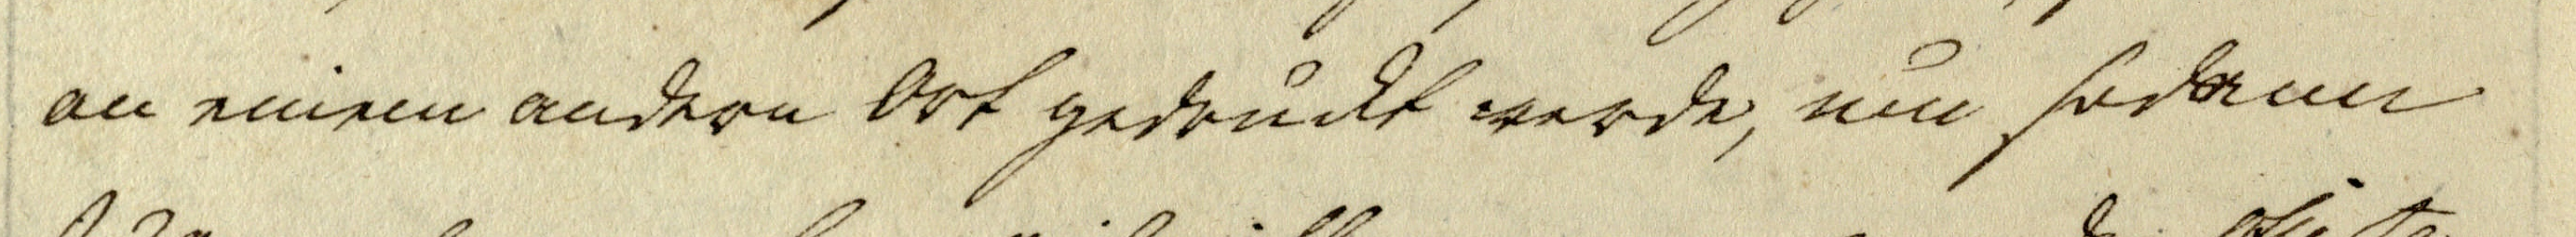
an einem andern Ort gedruckt werde, um sodann
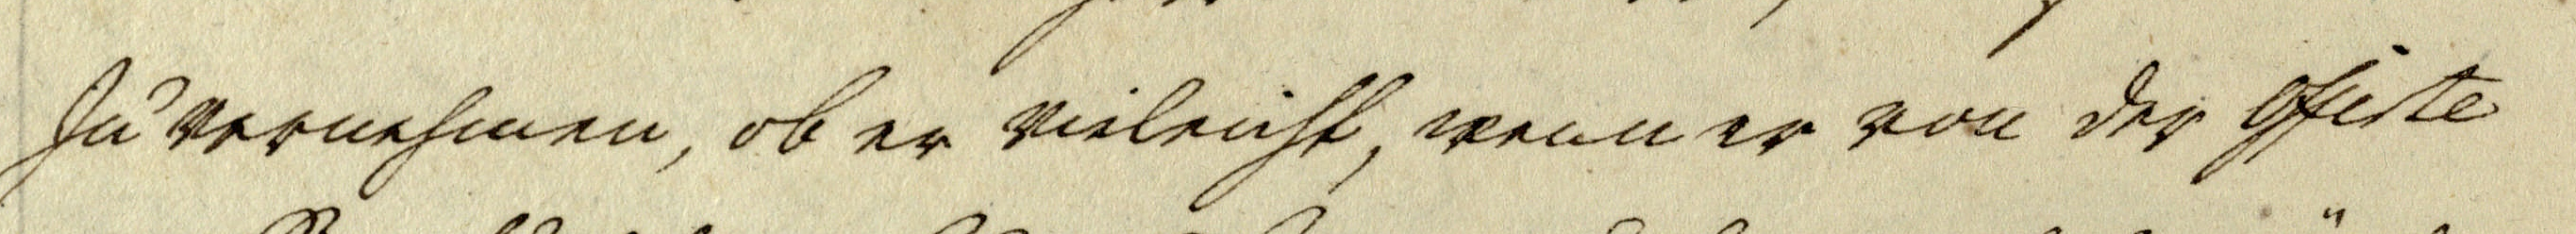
zu vernehmen, ob er vieleicht, wenn er von der Offerte
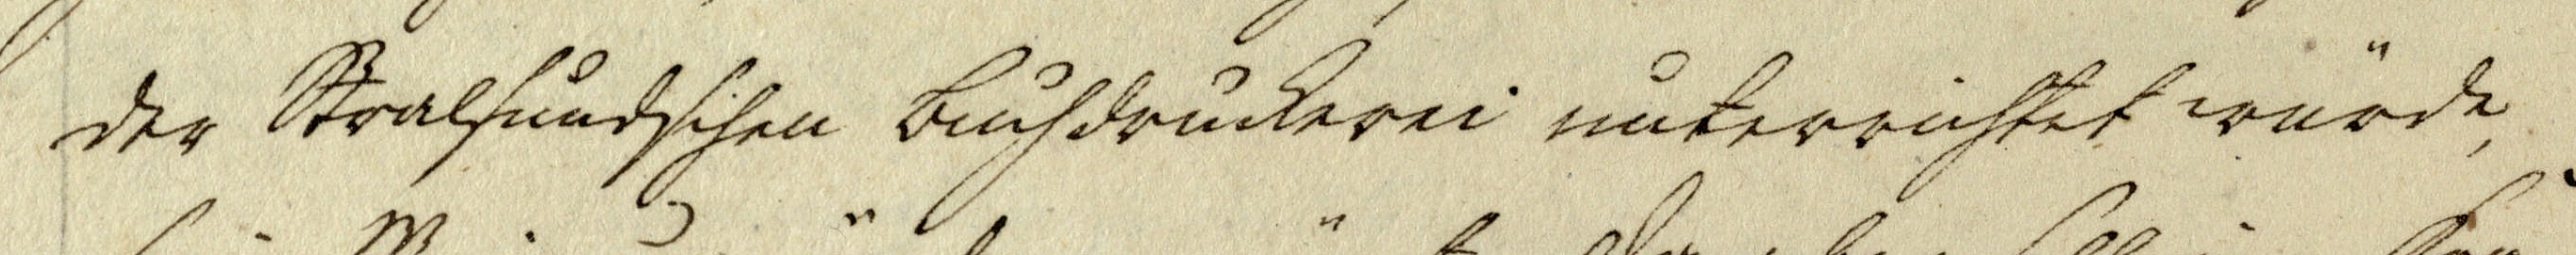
der Stralsundschen Buchruckerei unterrichtet würde,
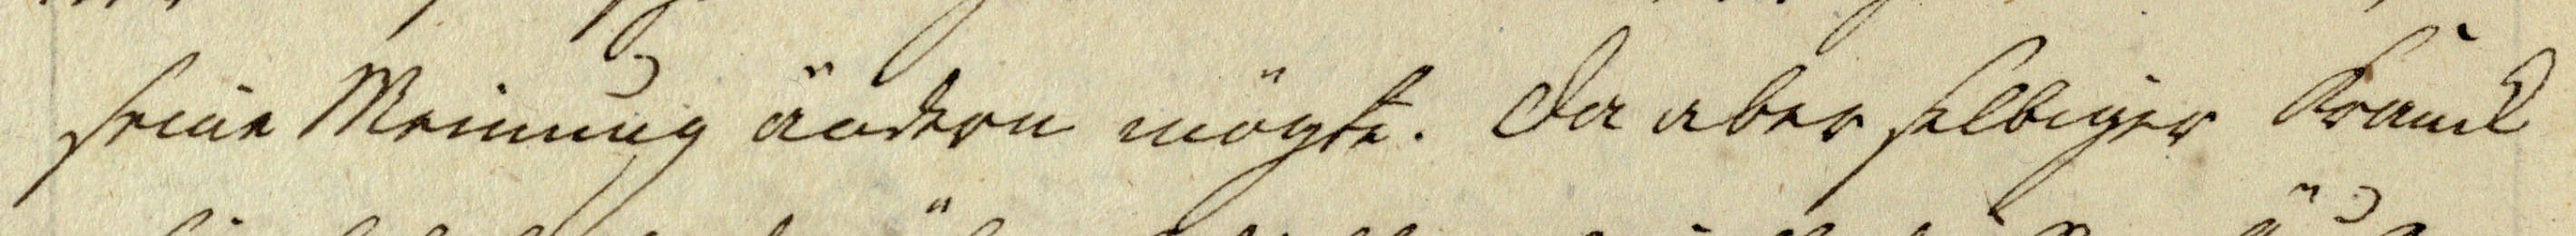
seine Meinung ändern mögte. Da aber selbiger kranck
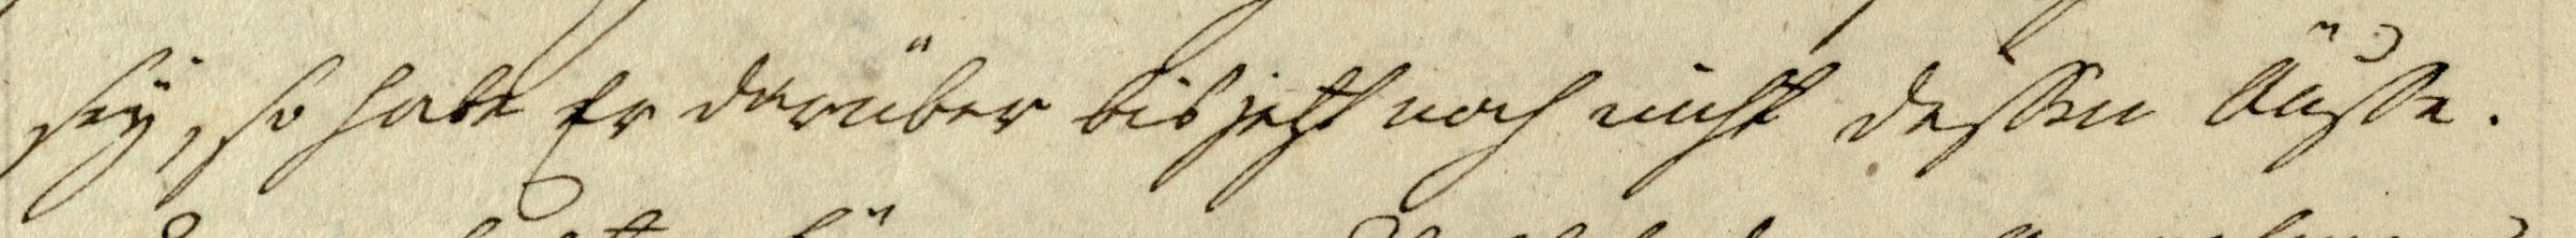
seÿ, so habe Er darüber bis jetzt noch nicht dessen Äusse¬
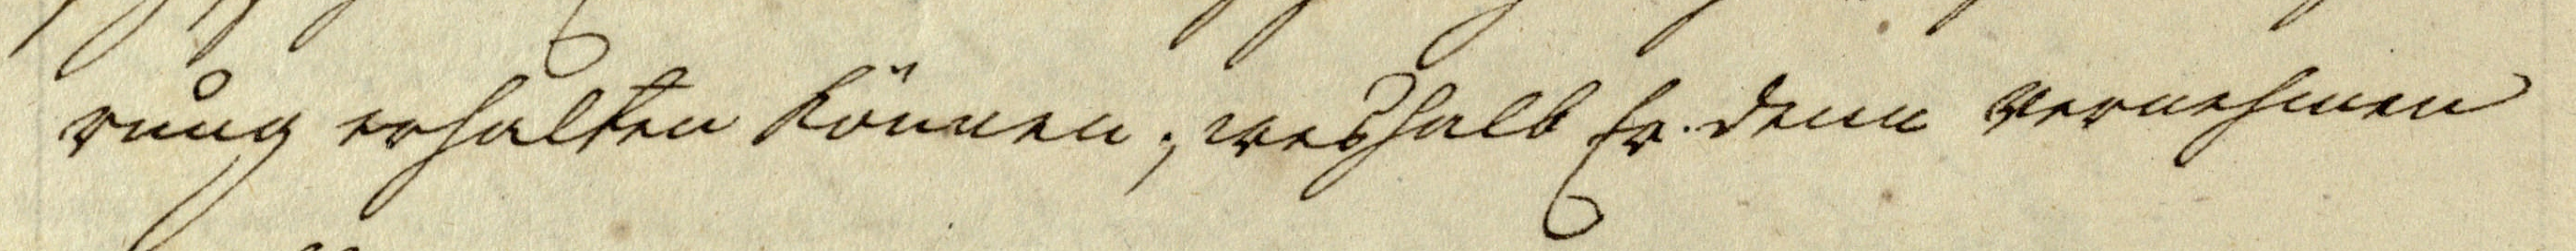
rung erhalten können; weshalb Er denn vernehmen
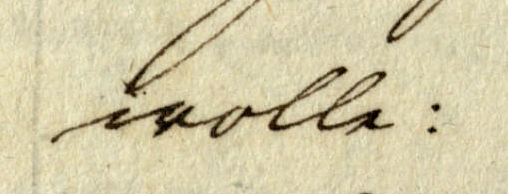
wolle:
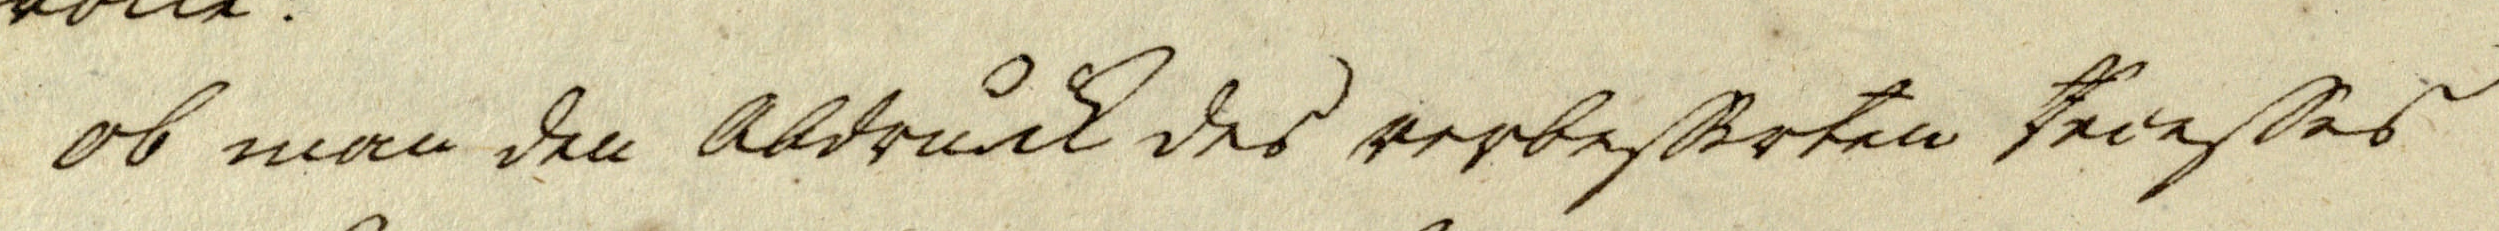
ob man den Abdruck des verbesserten Recesses
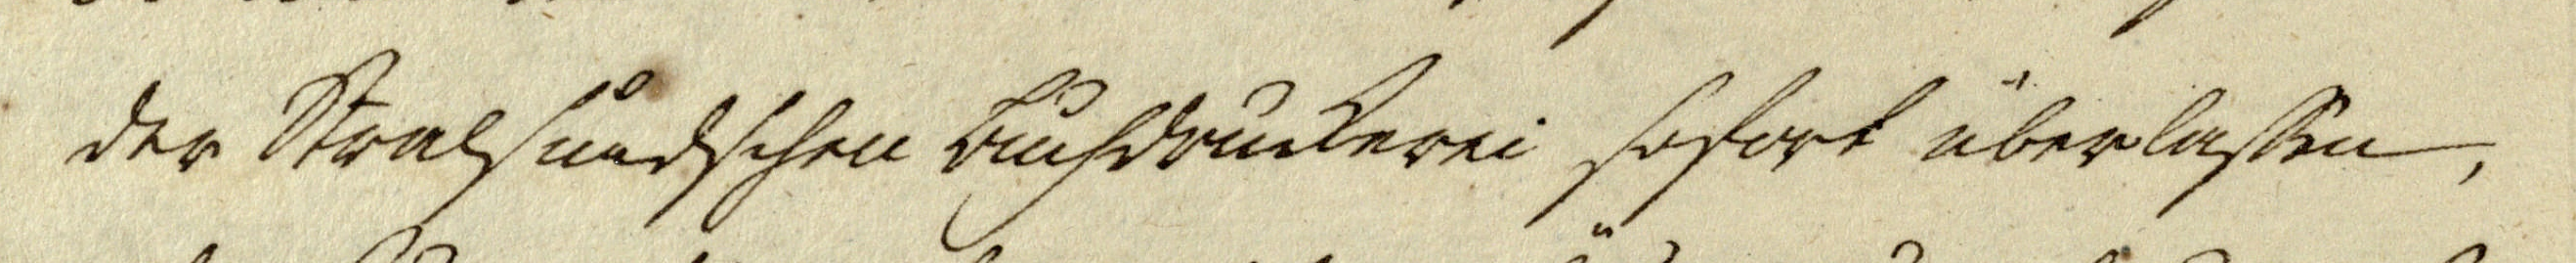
der Stralsundschen Buchdruckerei sofort überlassen,
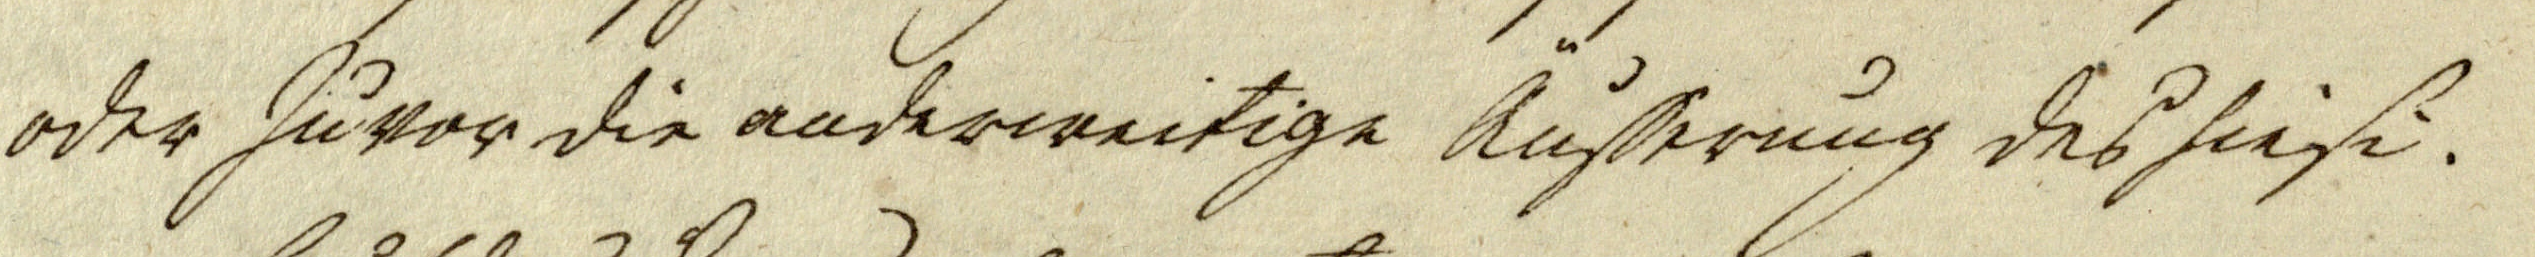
oder zuvor die anderweitige Äusserung des hiesi¬
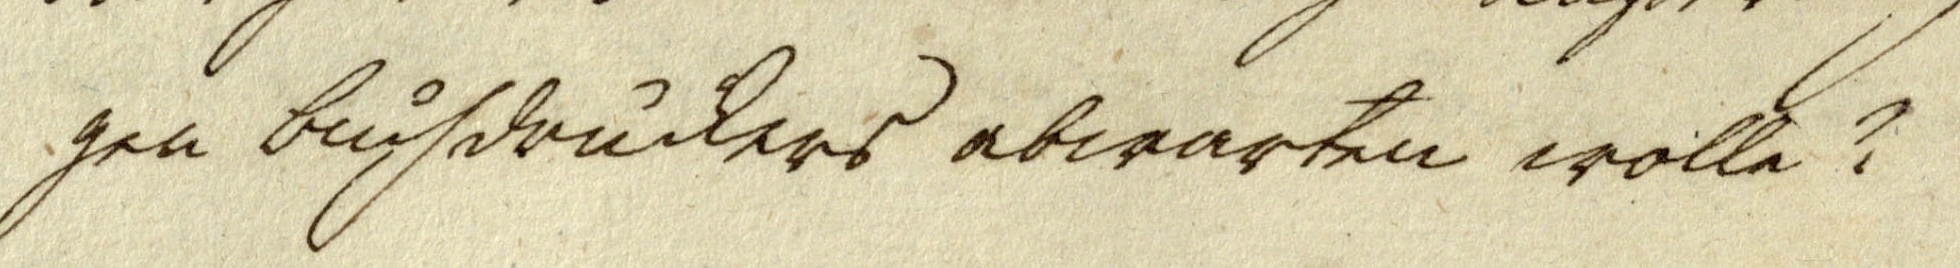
gen Buchdruckers abwarten wolle?
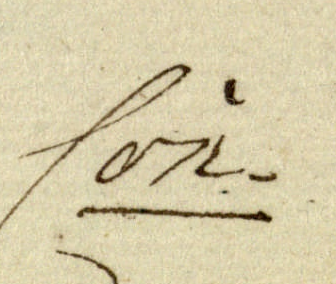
Con¬
